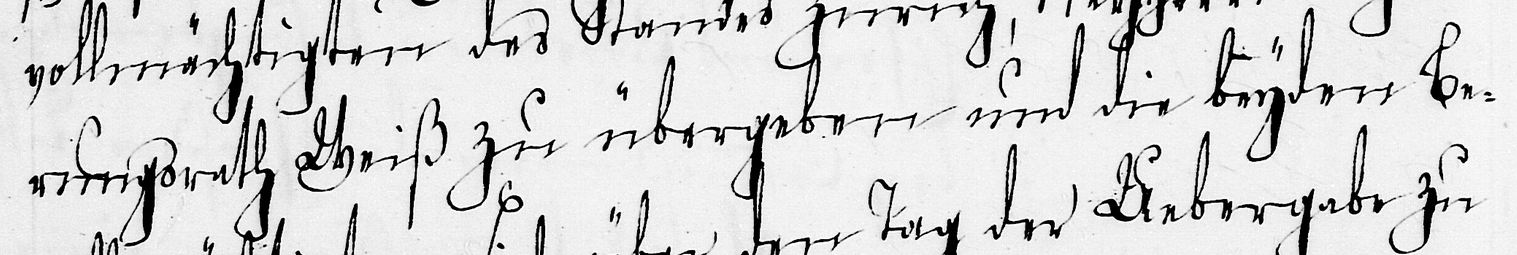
rungsrath Weiß zu übergeben und die beyden Be¬
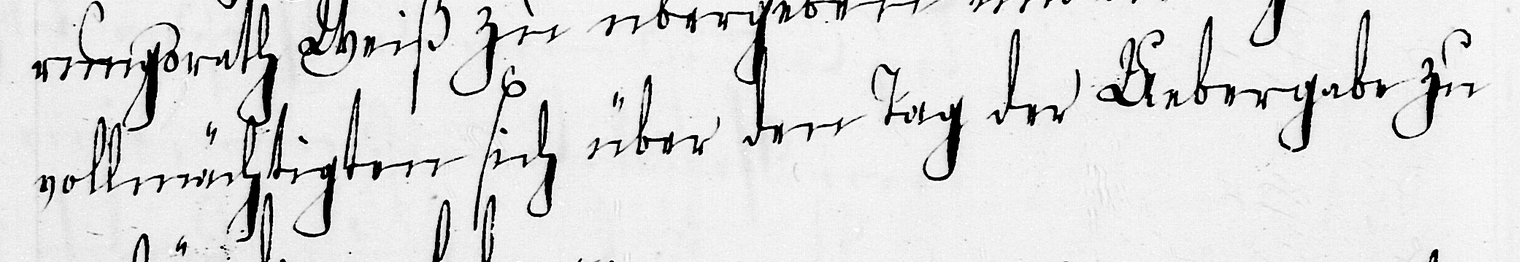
vollmächtigten sich über den Tag der Uebergabe zu
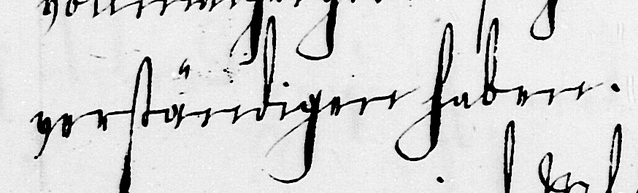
verständigen haben.
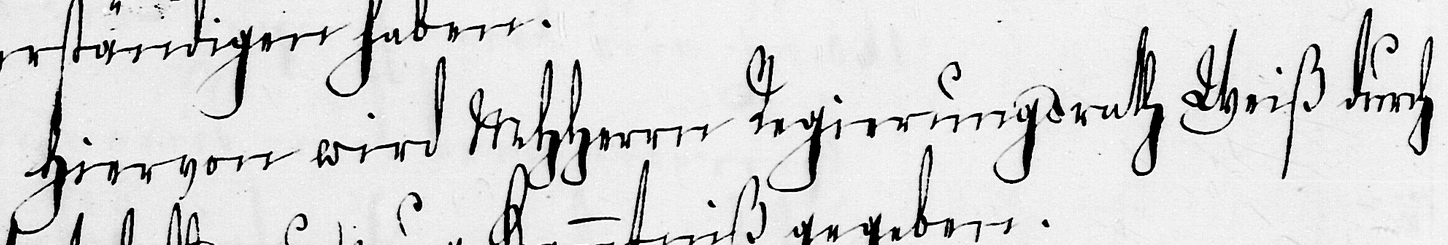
Hiervon wird MHHerrn Regierungsrath Weiß durch
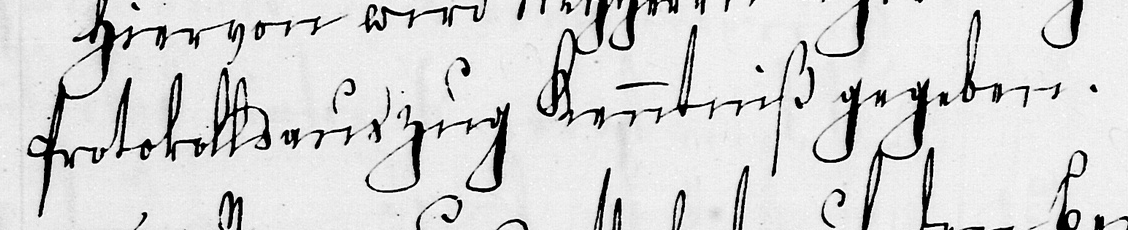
Protokollsauszug Kenntniß gegeben.
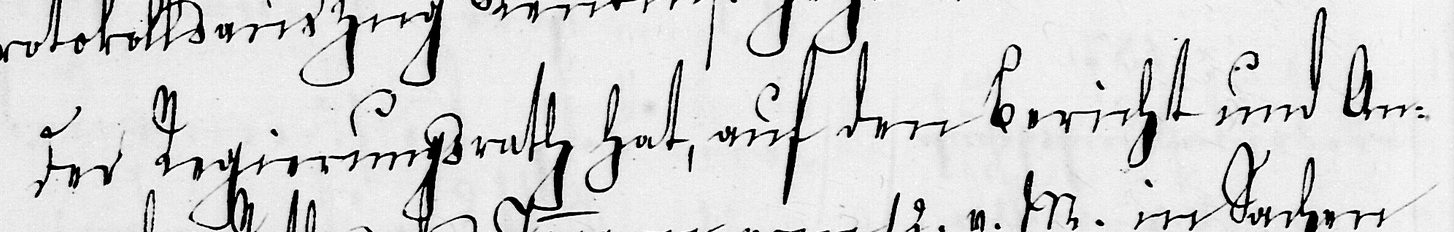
Der Regierungsrath hat, auf den Bericht und An¬
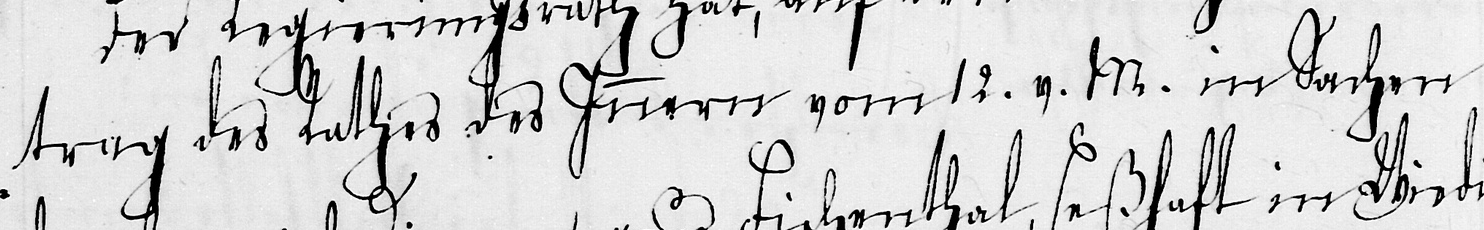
trag des Rathes des Innern vom 12. v. M. in Sachen
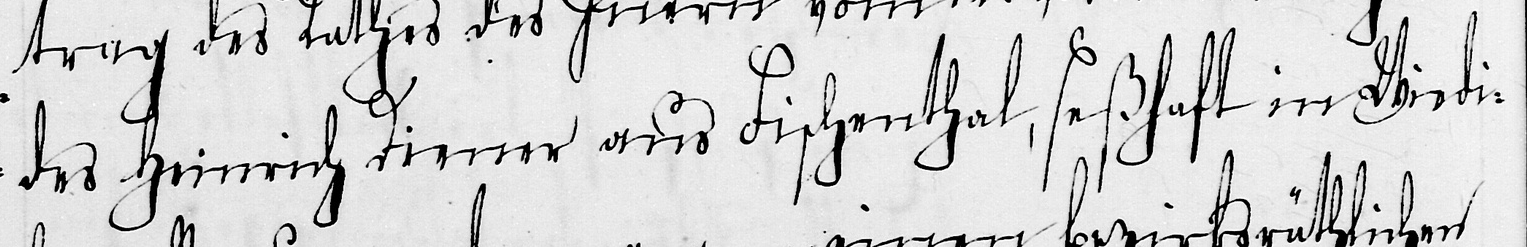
des Heinrich Diener aus Fischenthal, seßhaft in Wiedi¬
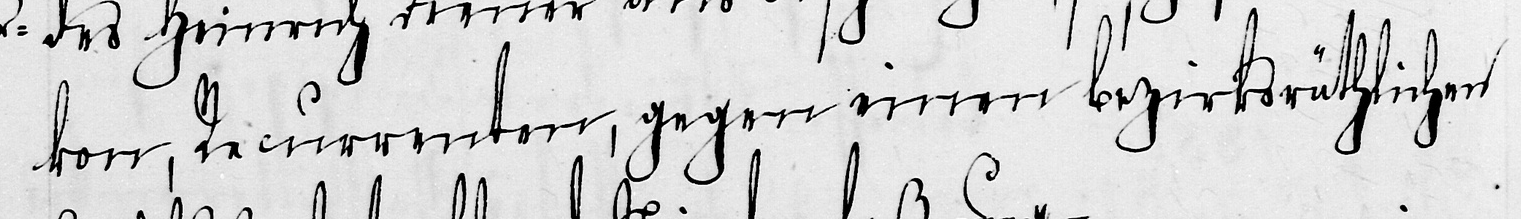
kon, Recurrenten, gegen einen bezirksräthlichen
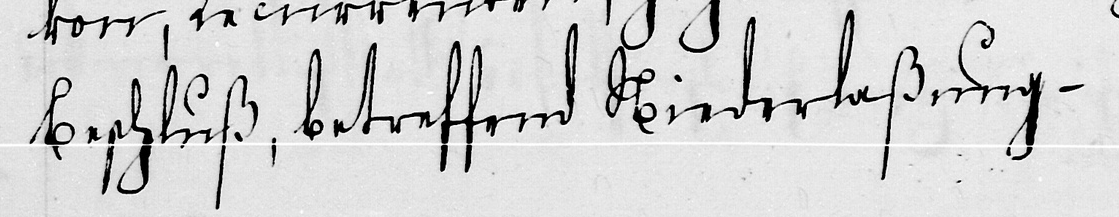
Beschluß, betreffend Niederlaßung
